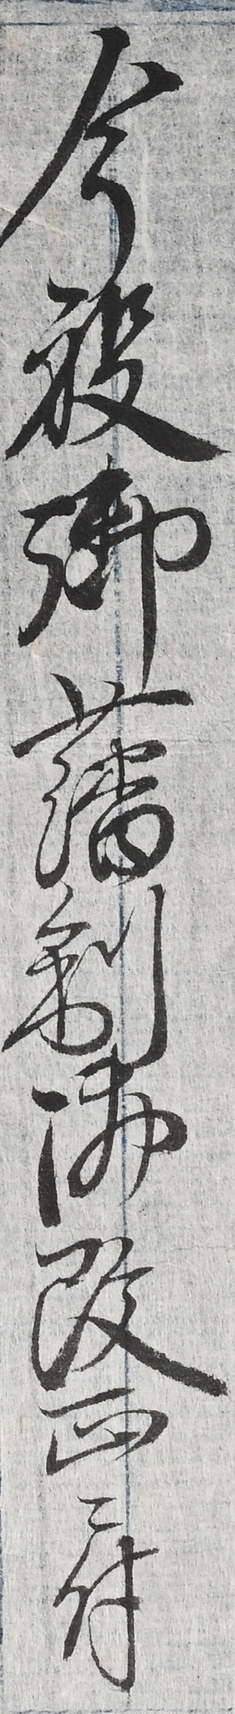今般御藩制御改正ニ付
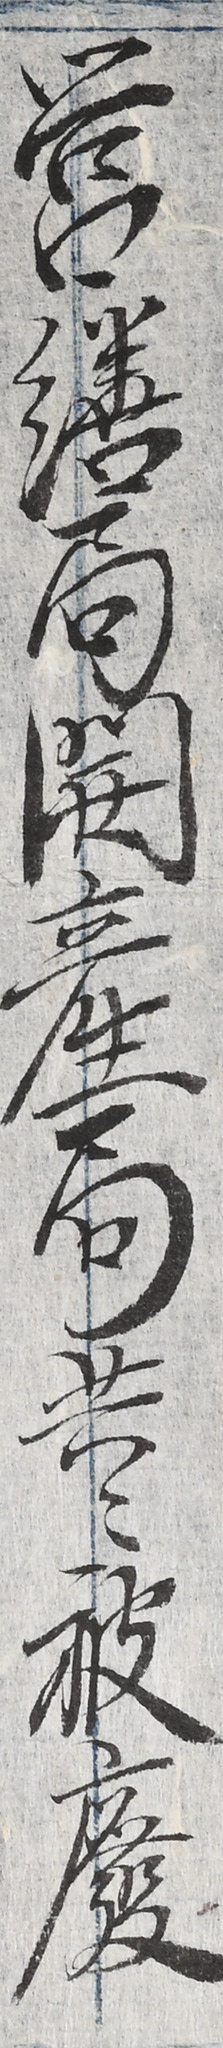営繕局開産局共々被廃
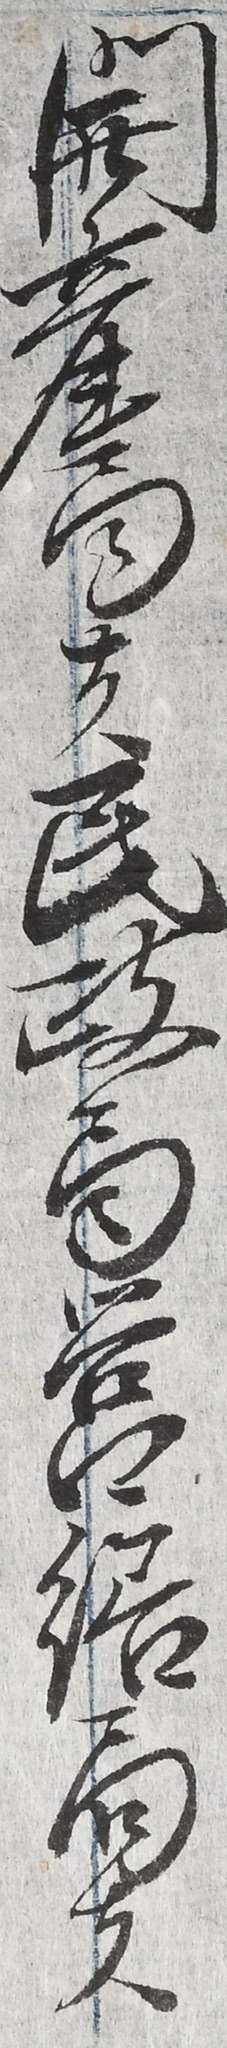開産局者民政局営繕局者
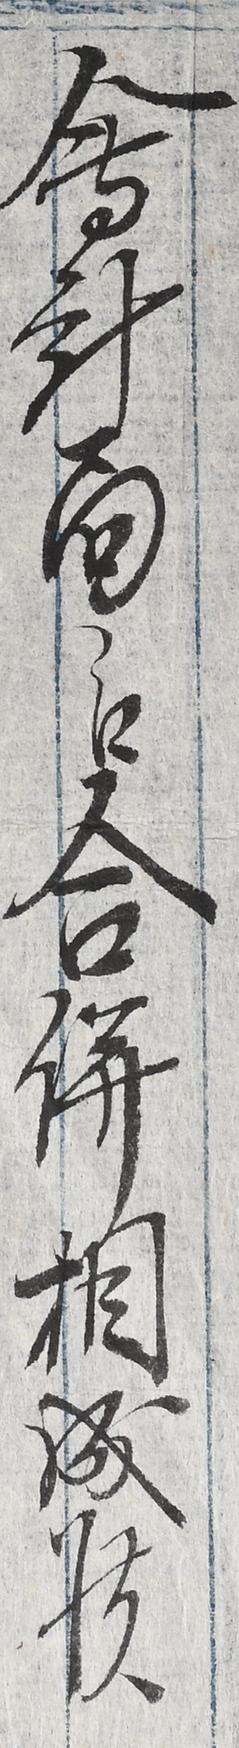会計局江合併相成候
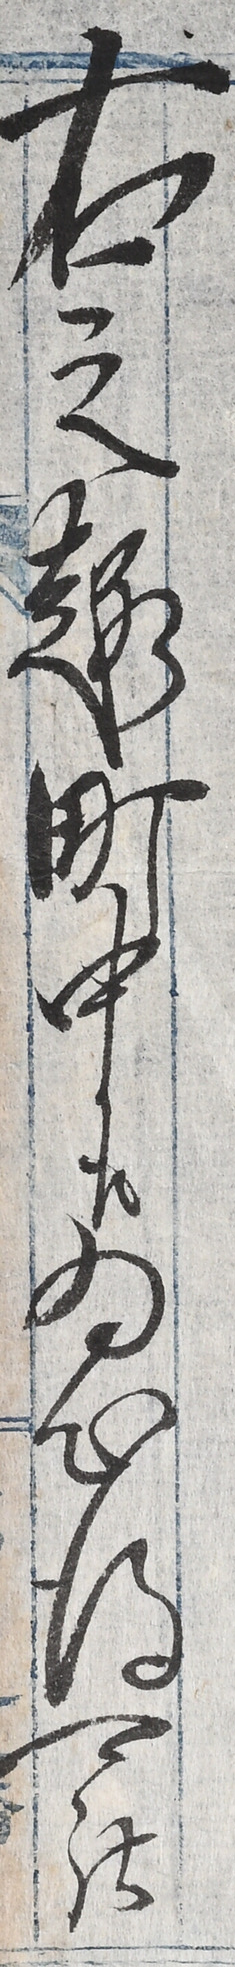右之趣町中江為心得可被
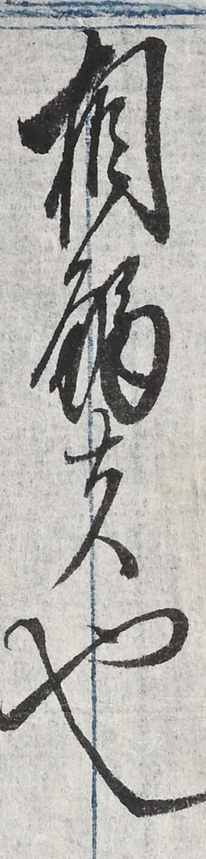相触者也
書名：（触書）
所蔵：伊那市立高遠町図書館・合同会社AMANE
